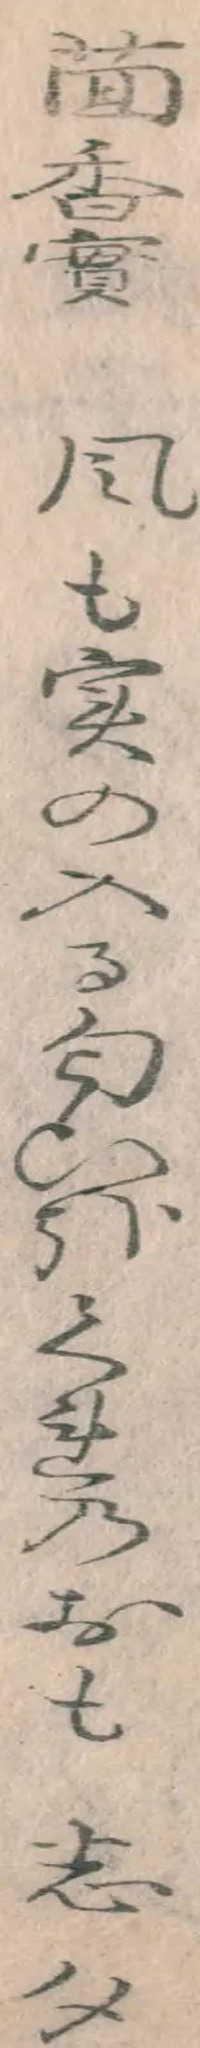茴香実風も実の入る匂ひ哉くれのおも志夕
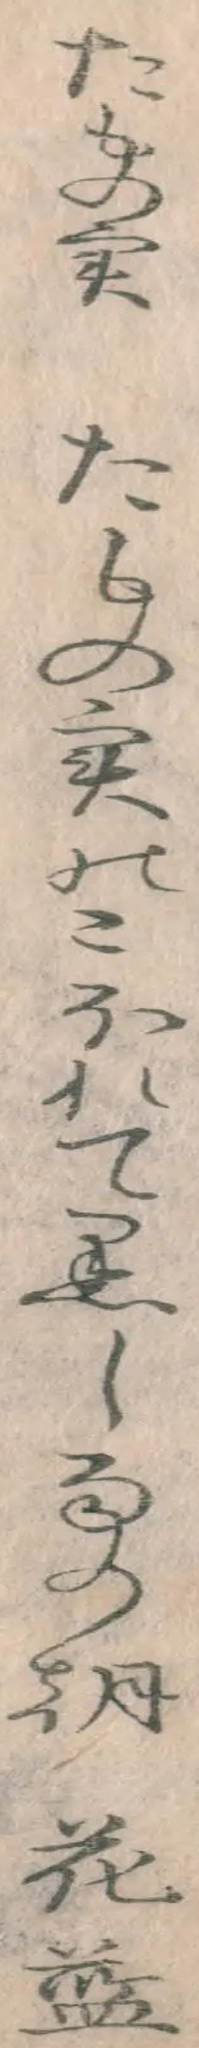たもの実たもの実のこほれて黒し雨の朝花藍
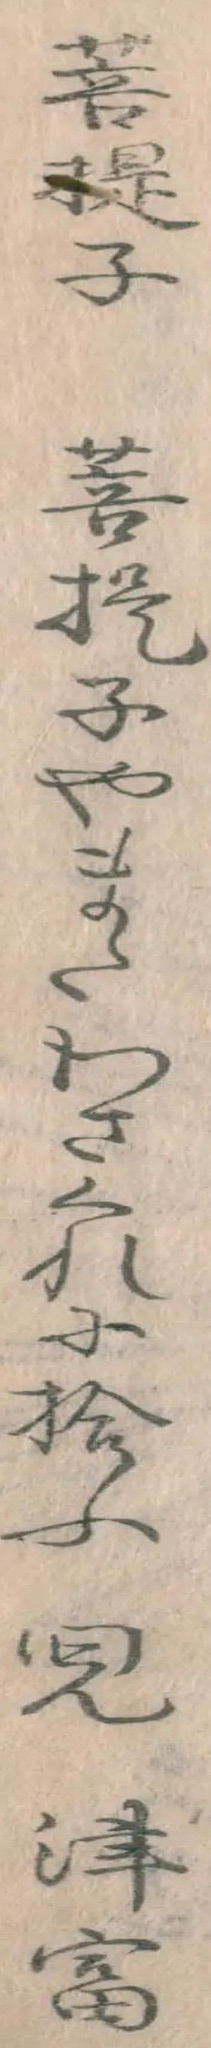菩提子菩提子やまたわさくれに拾ふ児津富

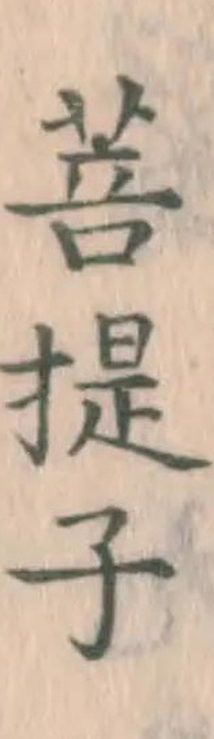菩提子
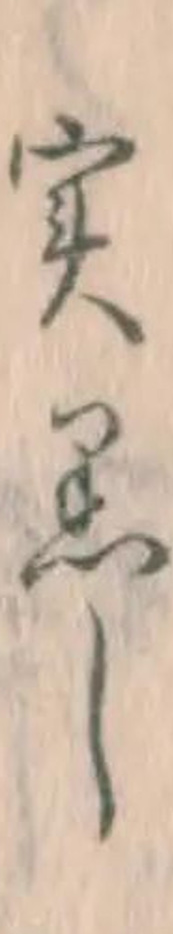実黒し
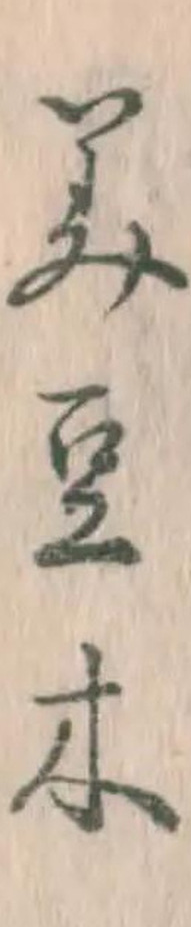美豆木
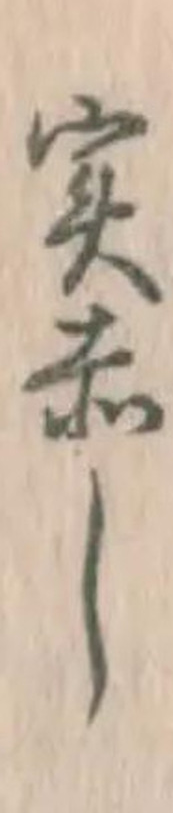実赤し

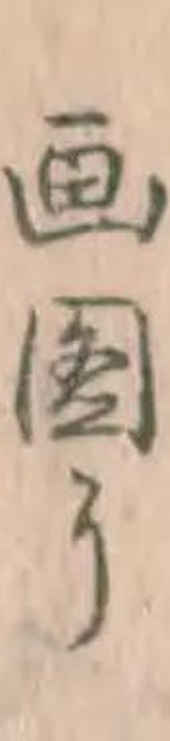画図に
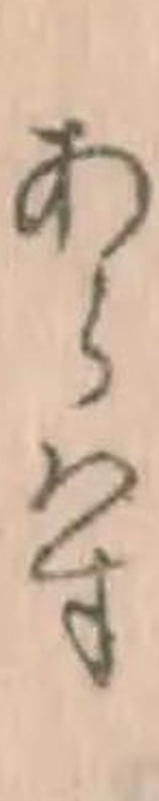あらはす
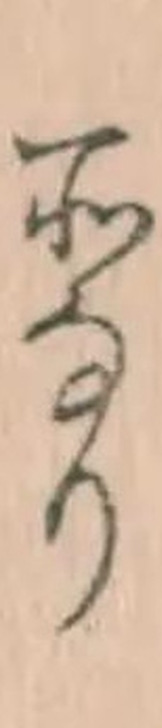所なり
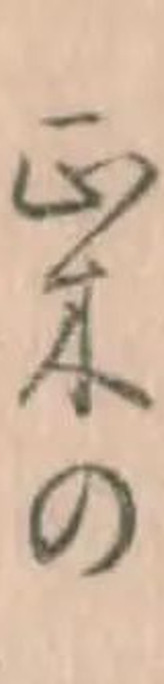此木の
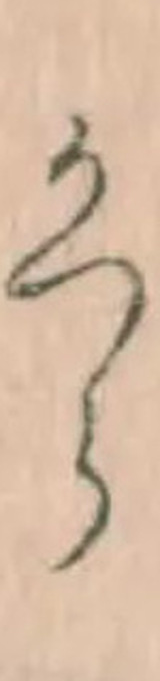かつら
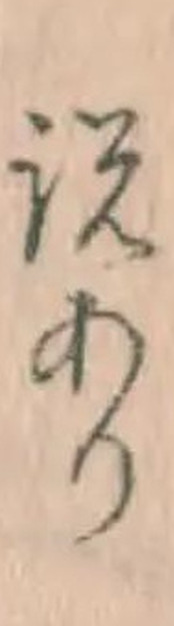説あり
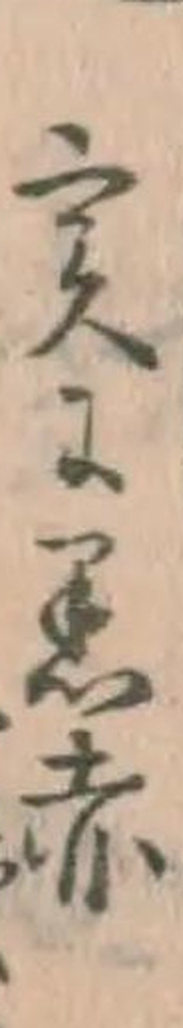実に黒赤
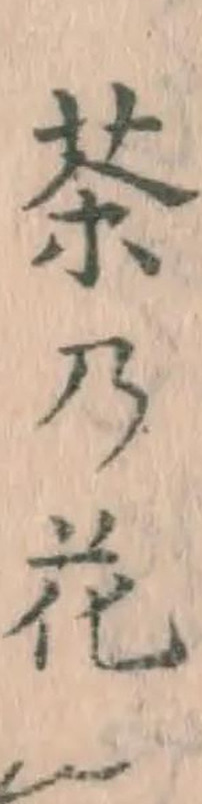茶乃花
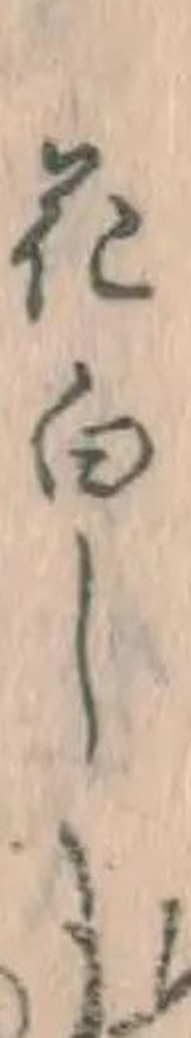花白し
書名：誹諧名知折 2巻. [2]
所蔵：国立国会図書館 National Diet Library, JAPAN
